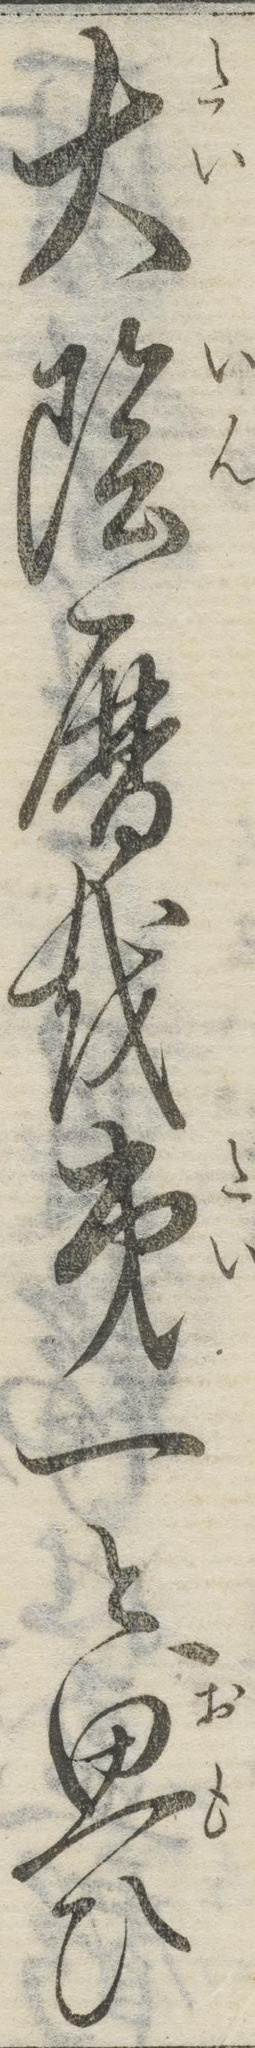太陰暦を第一と、思ひ
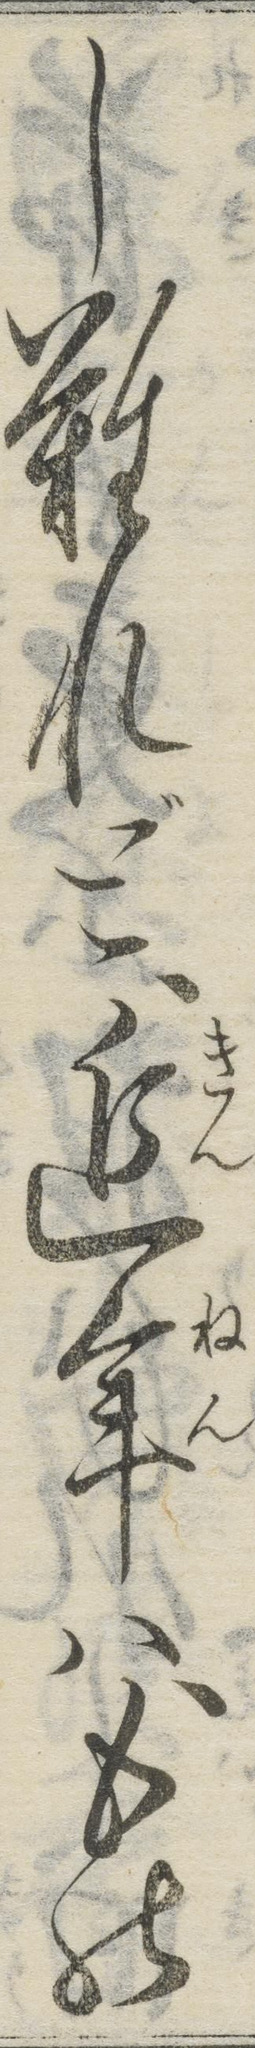しなれど、近年は、もの
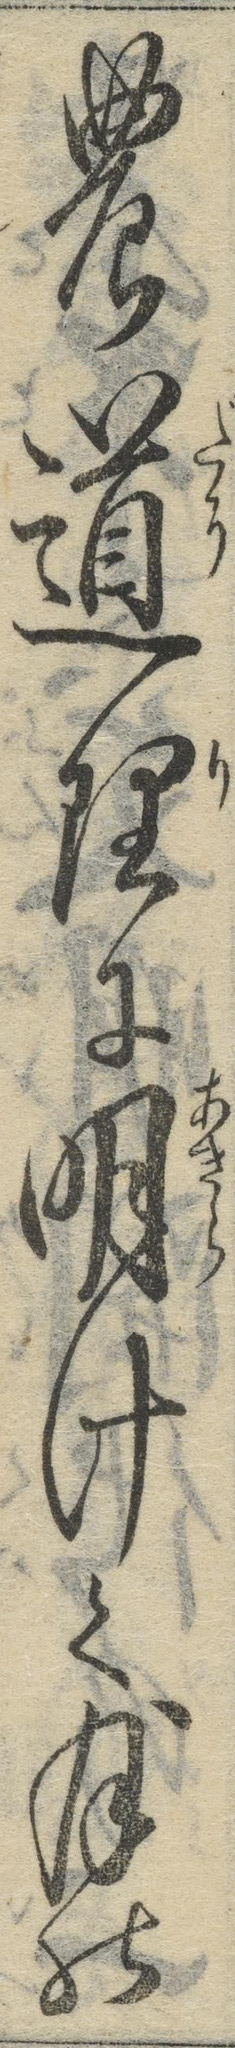の道理に明けく、月の
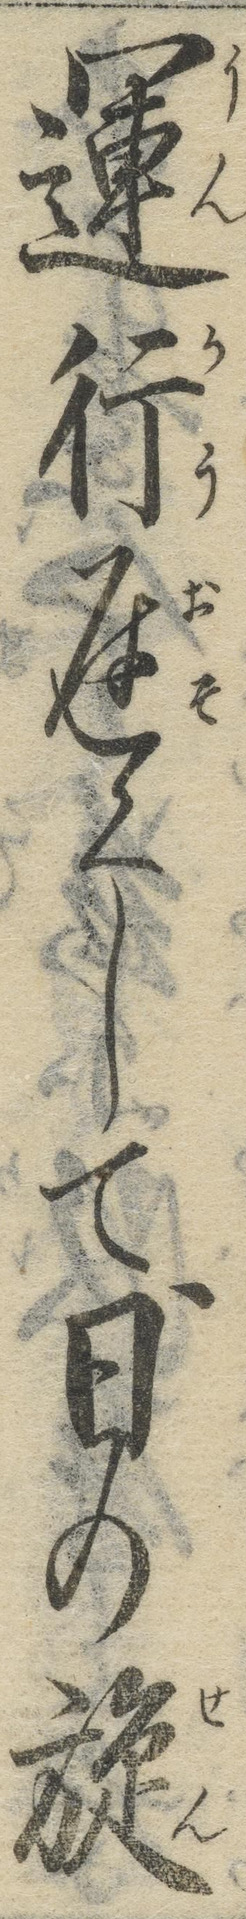運行遅くして、日の旋
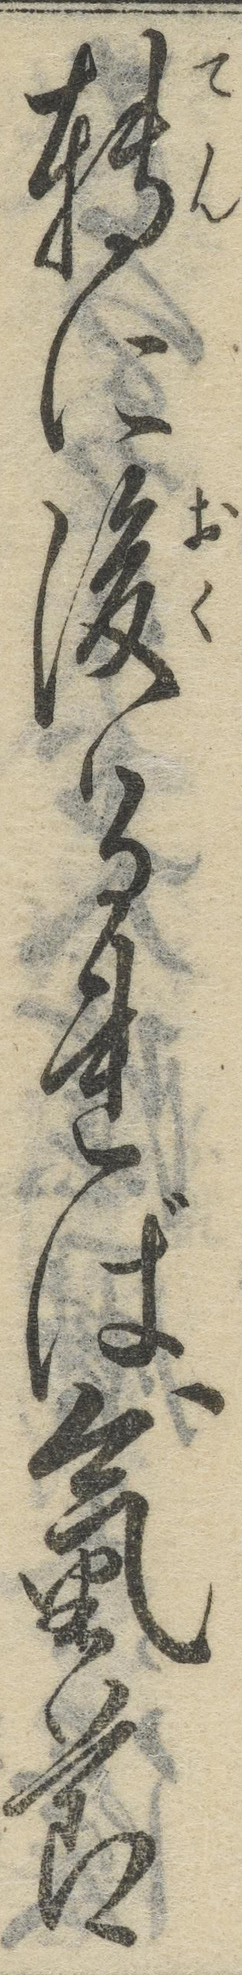転に後るれば、気節
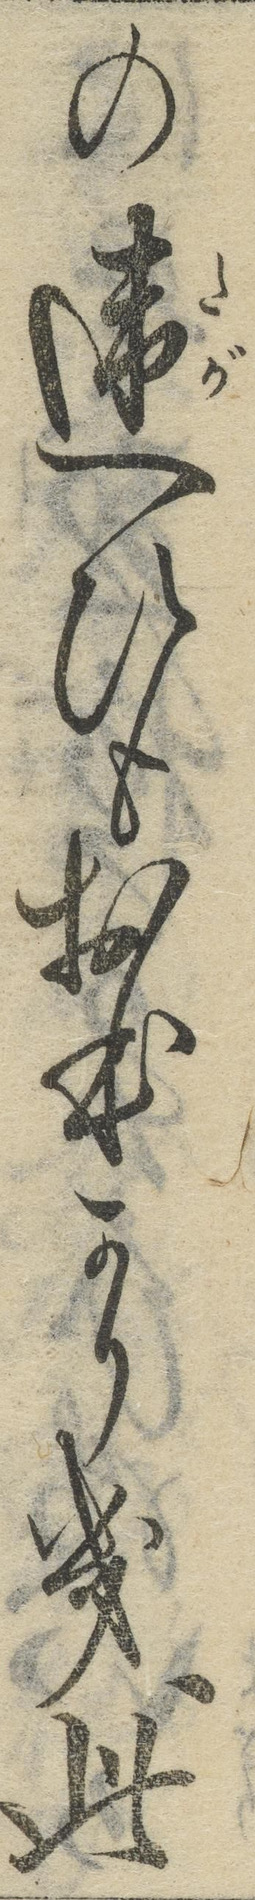の違ひもおほかりき、此
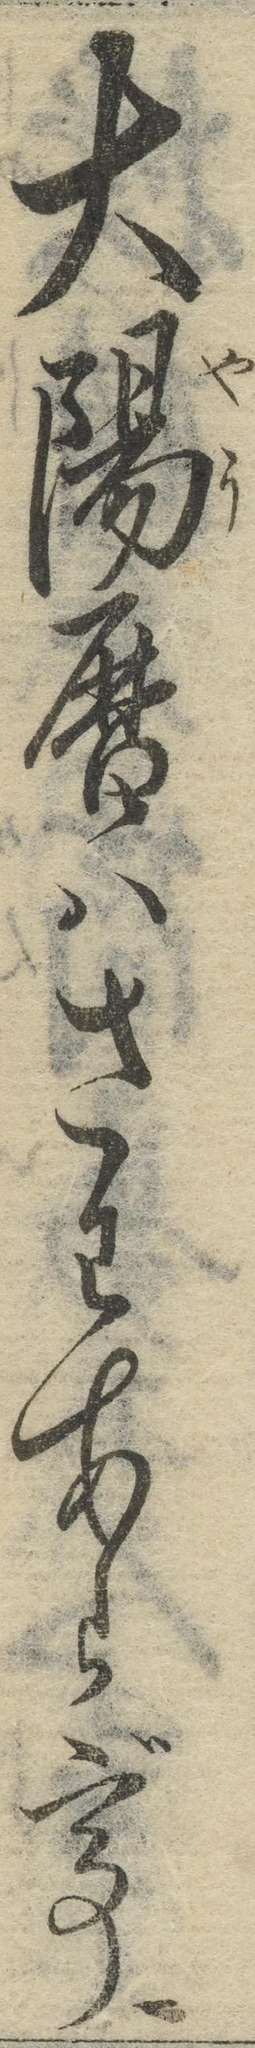大陽暦はさにあらで、

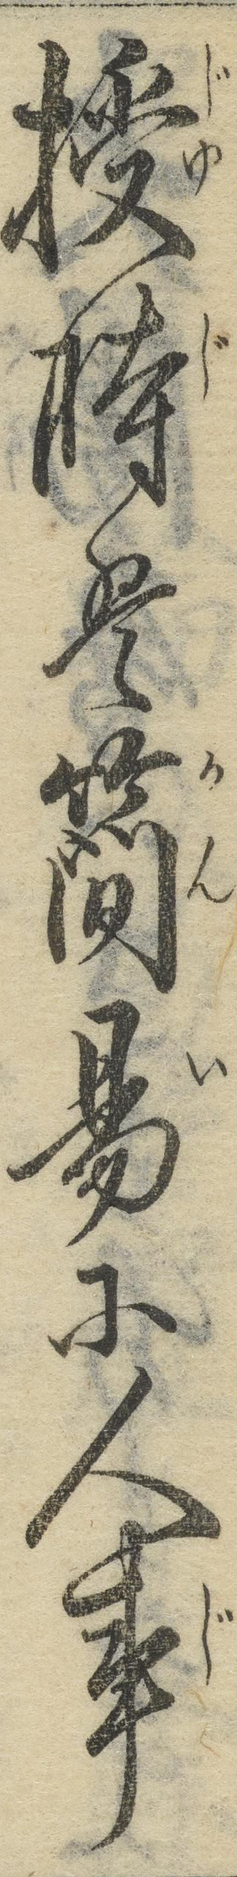授時は簡易に人事
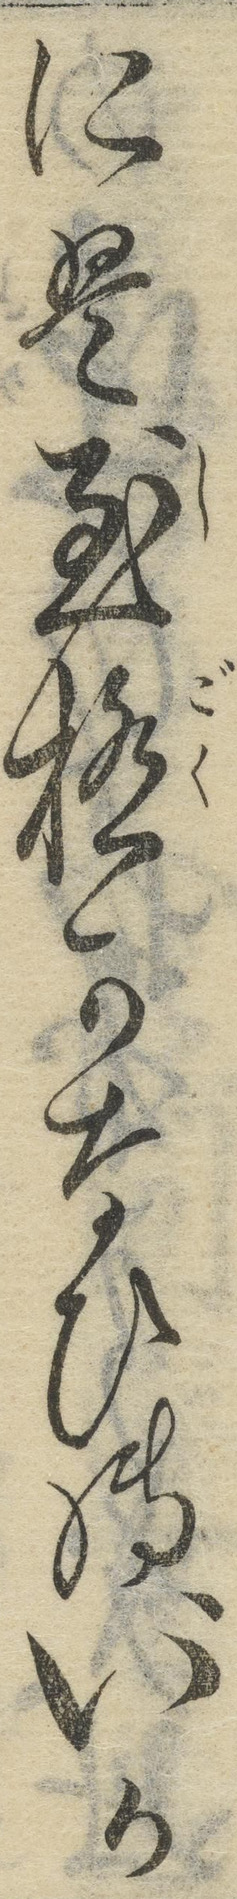には、至極かなひて、いか
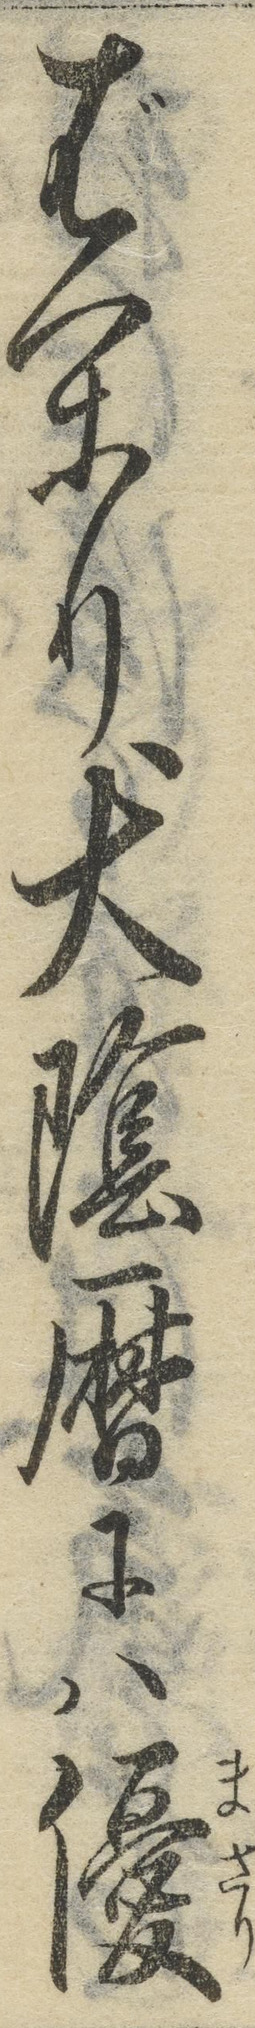ばかり、太陰暦には優
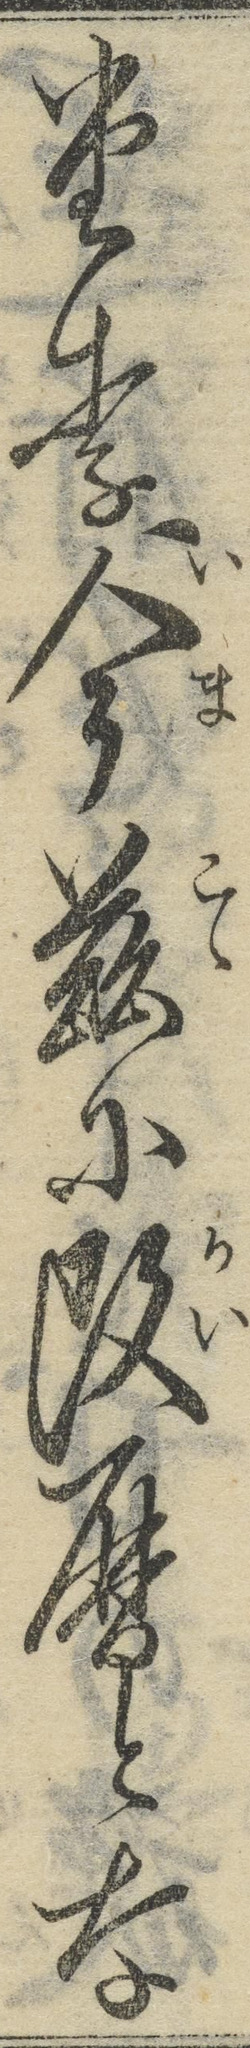たり、今茲に改暦とな
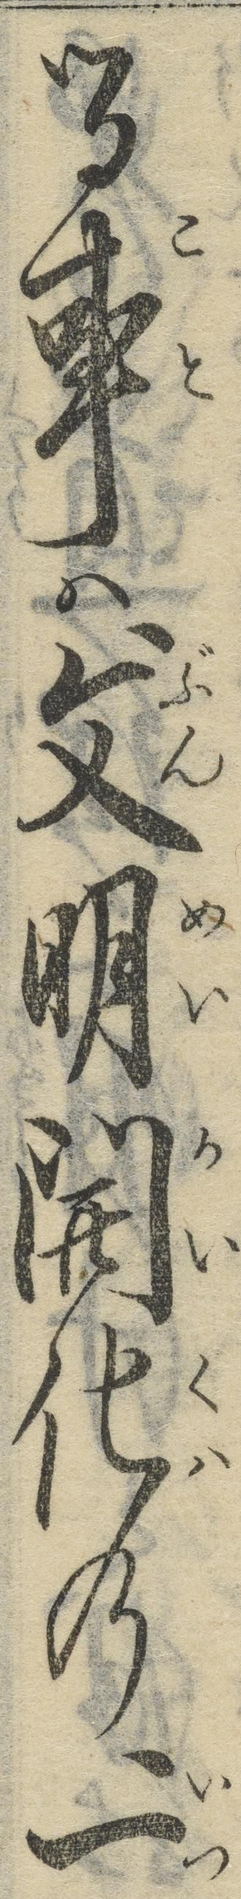る事は、文明開化の、一
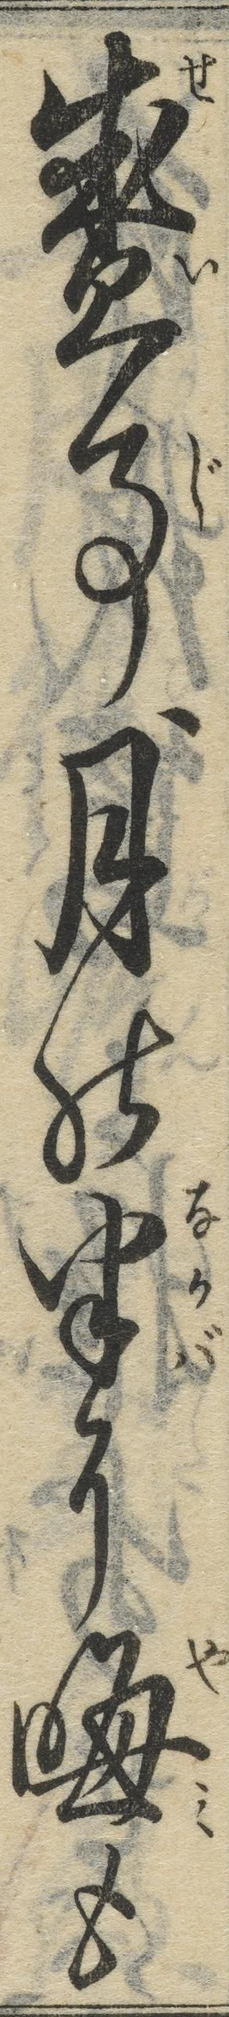盛事、月の半に晦も
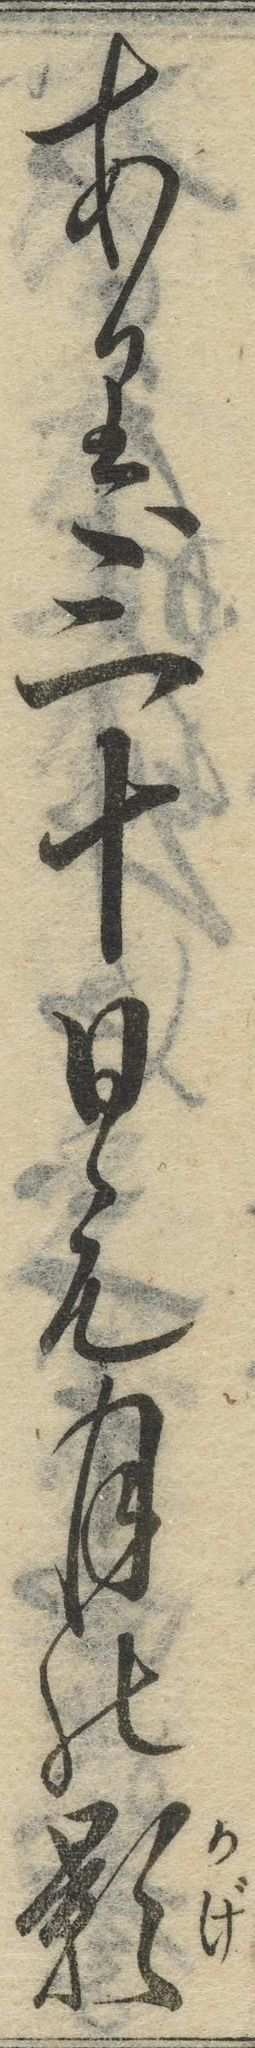あり、三十日も月の影
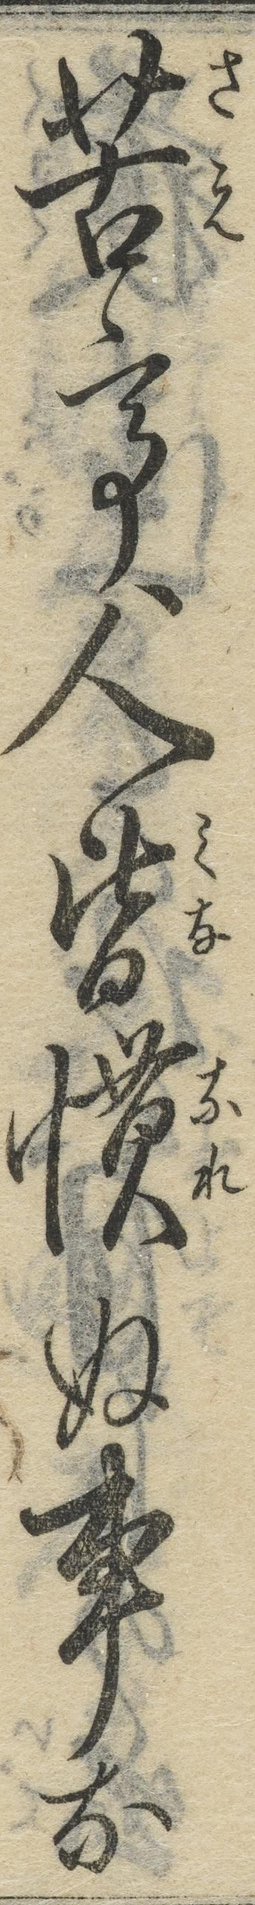苦て、人皆慣ぬ事な
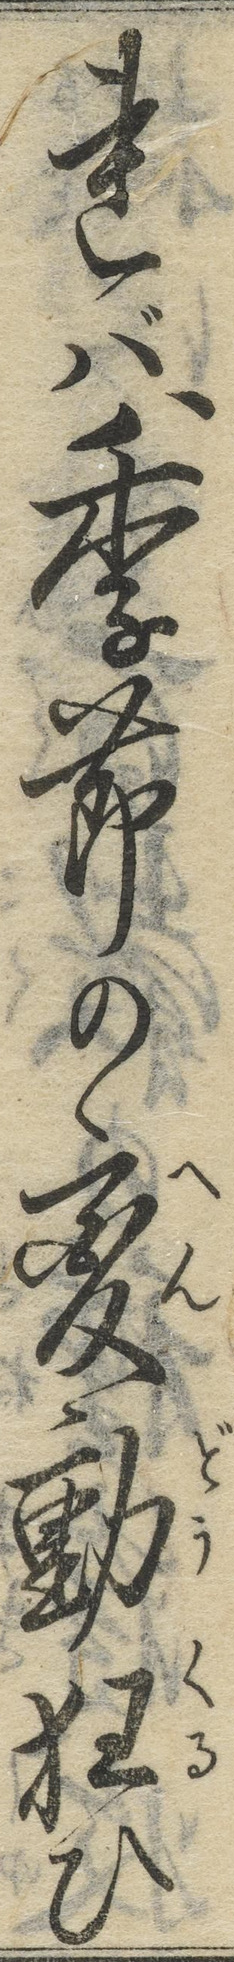れば、季節の変動狂ひ
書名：暦日往来　單
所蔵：東京大学地震研究所図書室 Earthquake Research Institute Library, The University of Tokyo, JAPAN
